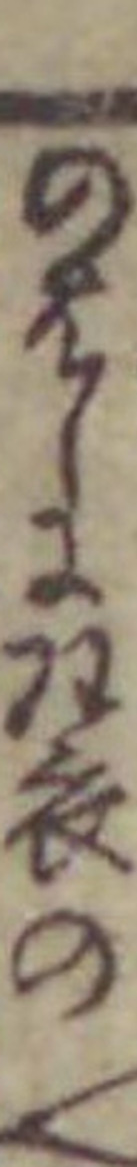のはしに羽衣の
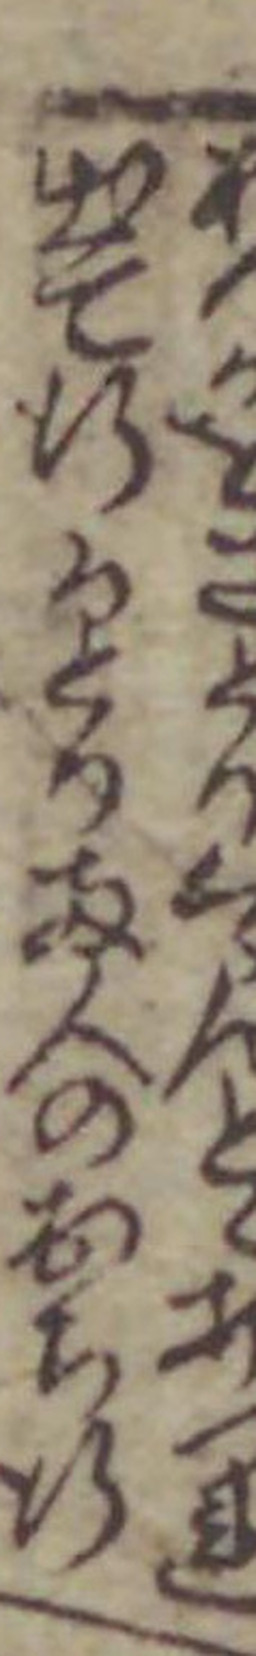出て行かとり両人のおち行
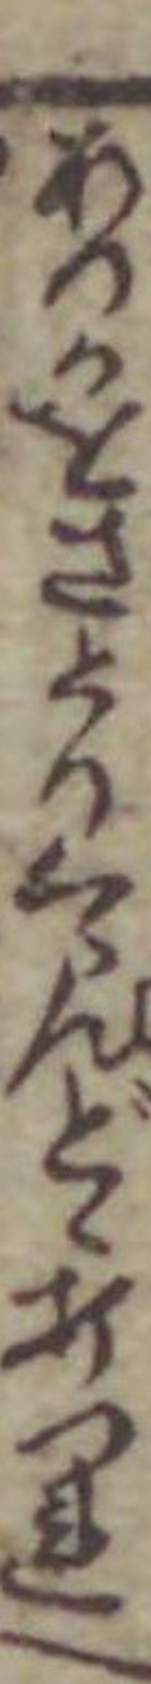ありかをさとりくらんどゝ打つれ
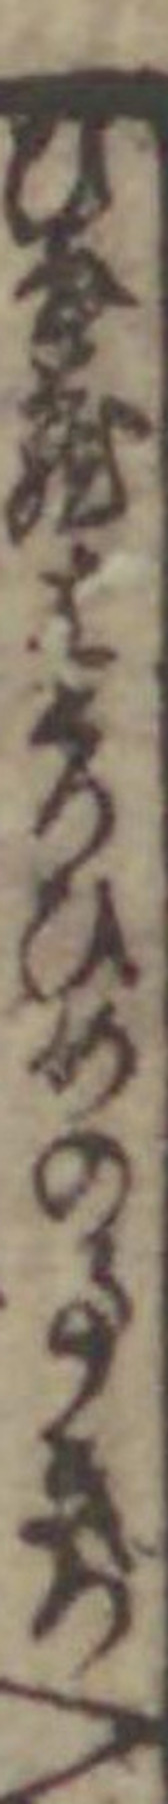ひな蔵はとりひめの事きづ
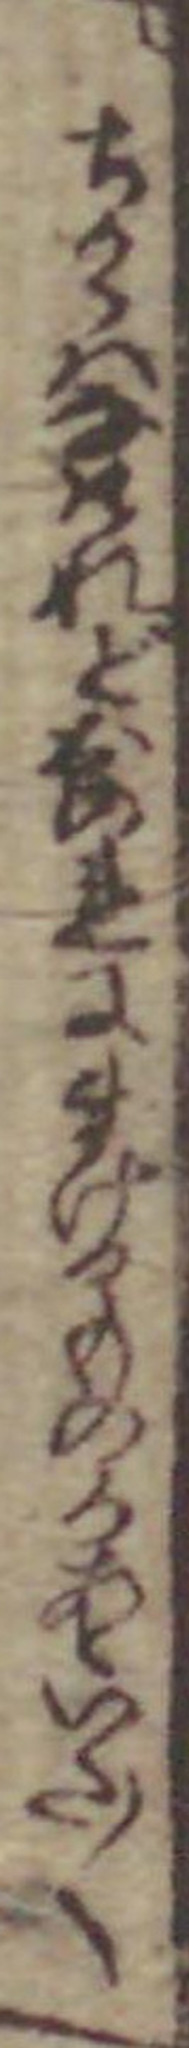ちからはなけれどおのれにまけるものかあゝいた〳〵
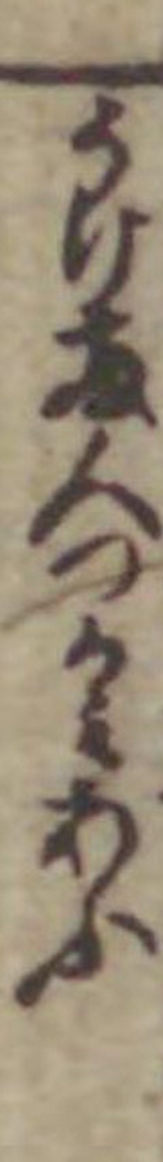うけ両人つかみあふ
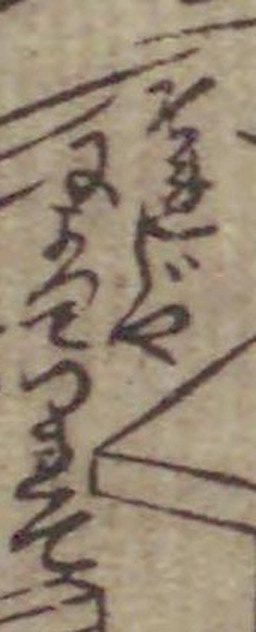によつてつれて
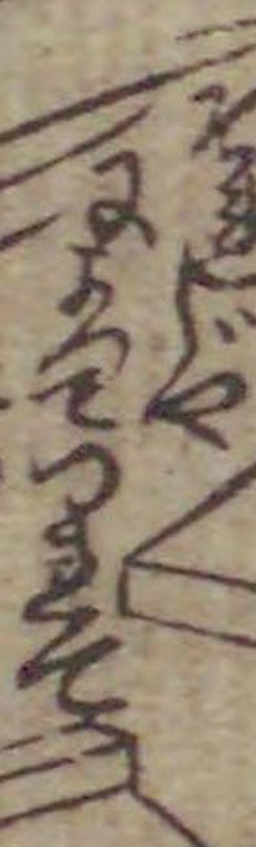によつてつれて
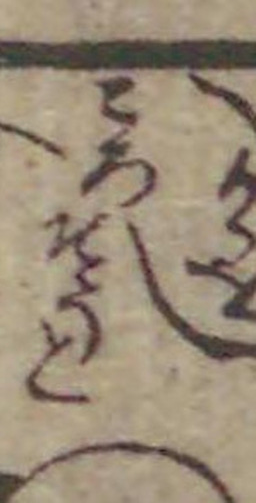ころそうと
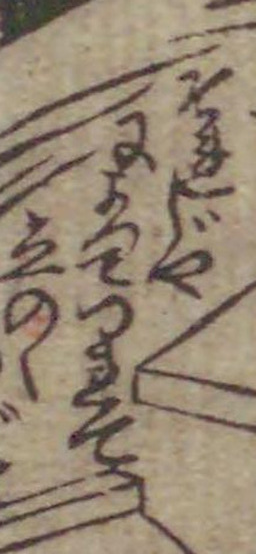によつてつれて
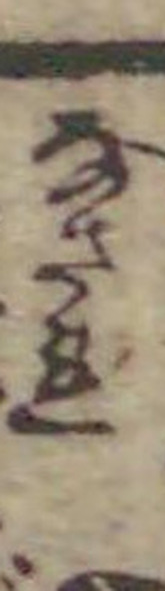なされ
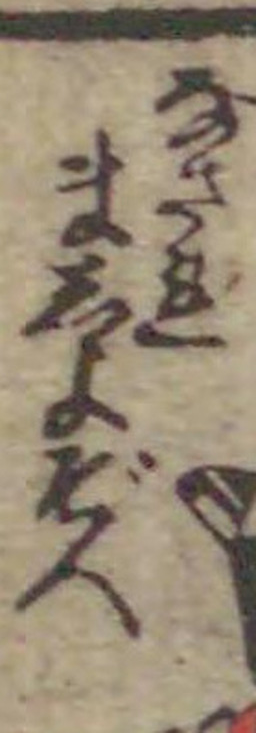ましよぞへ

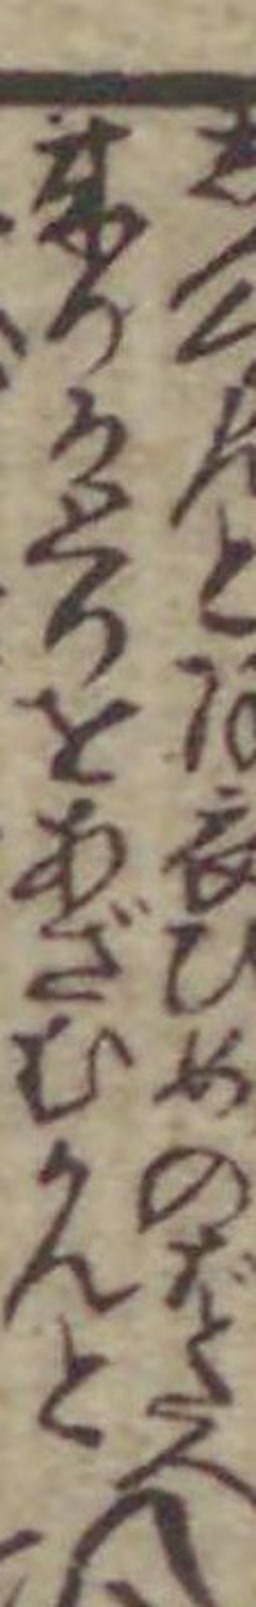来りかとりをあざむかんと
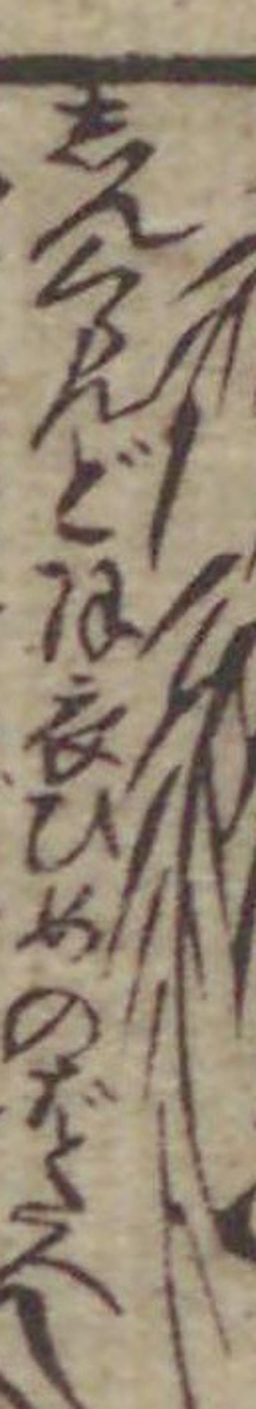しんくらんど羽衣ひめのばたへ
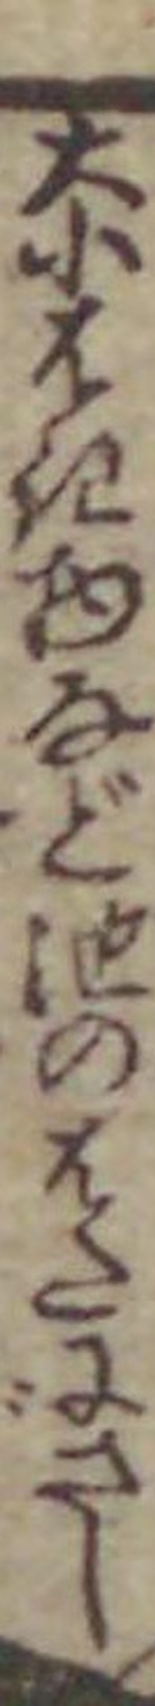大小はき物など池のはたにさし
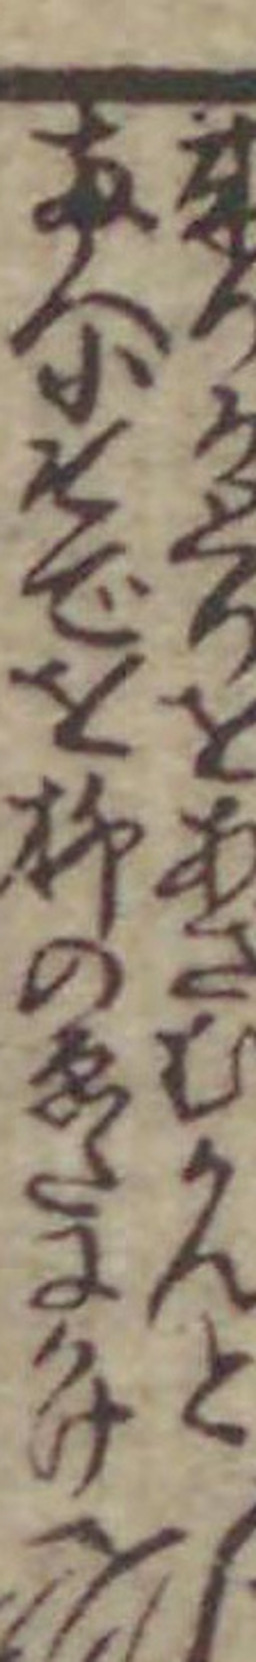両人小そでを柳のゑたにかけ
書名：娜二代鉢木 5巻
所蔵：国立国会図書館 National Diet Library, JAPAN
